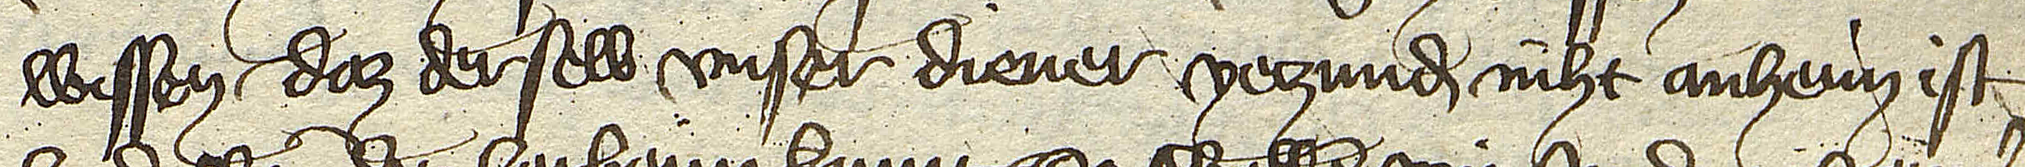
wiſſen / daʒ derſelb vnſer diener yecʒund* niht anheim iſt
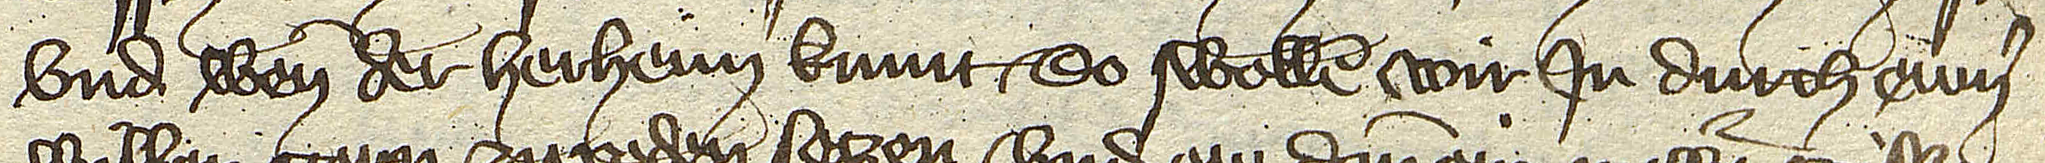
vnd wen* der herheim kumt / So wolle* wir In durch ewn*
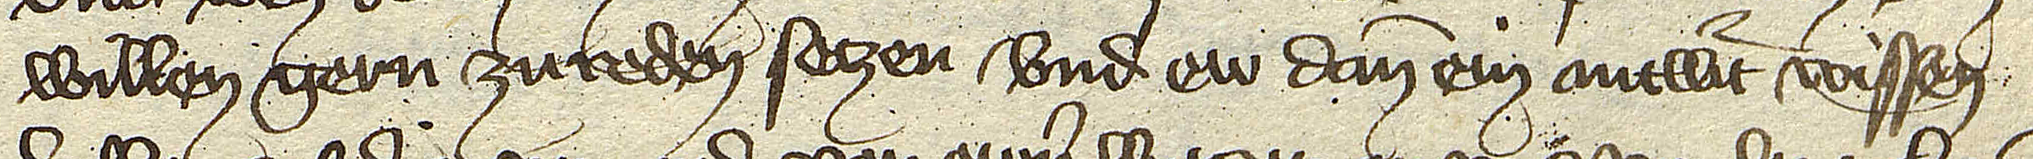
willen gern cʒu reden ſecʒen / vnd ew dan* ein antwt* wiſſen
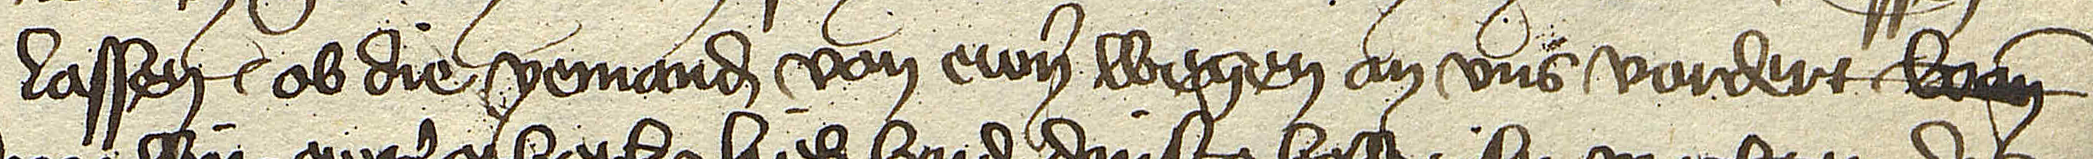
laſſen / ob die yemand* von ewn* wegen an vns vordert / wan*
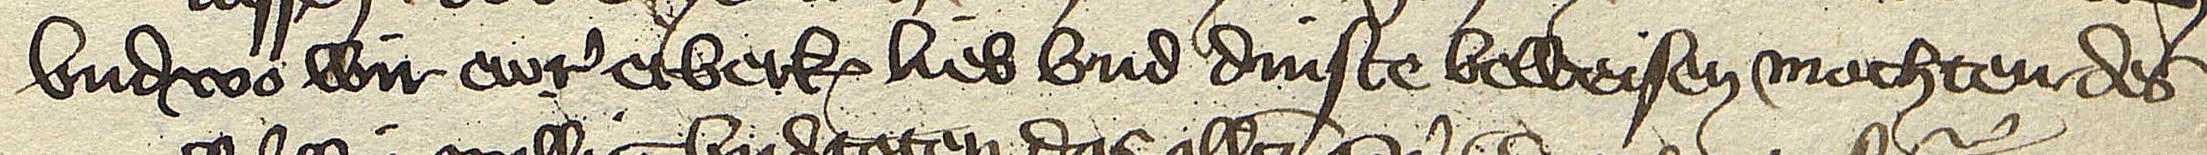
vnd wo wir ewr* erberk* lieb vnd dinſte beweiſen machten / des
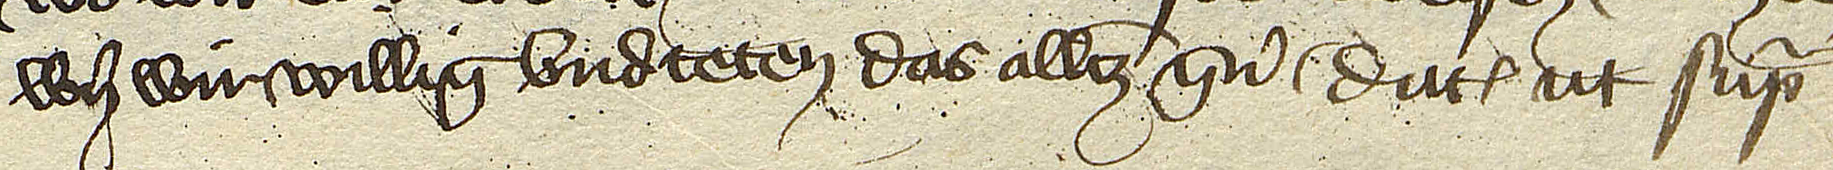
wn* wir willig vnd teten das allcʒ* gn* / dat* ut ſup*
